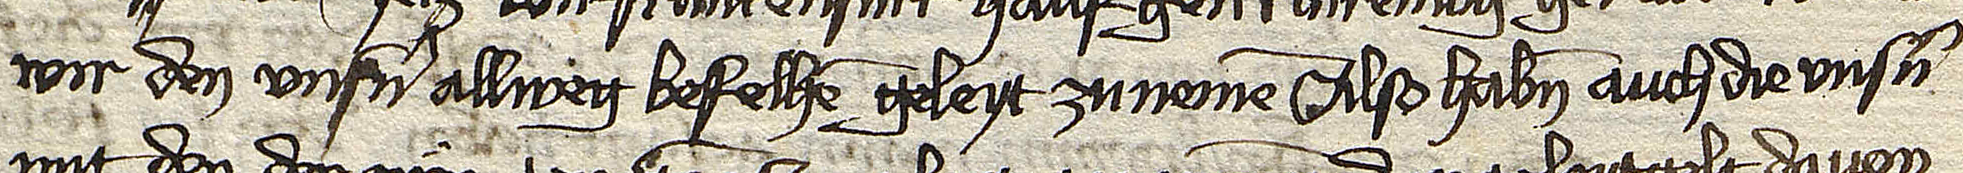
wir den vnſn* allweg befelhe* geleyt ʒu neme* Alſo habn* auch die vnſn*
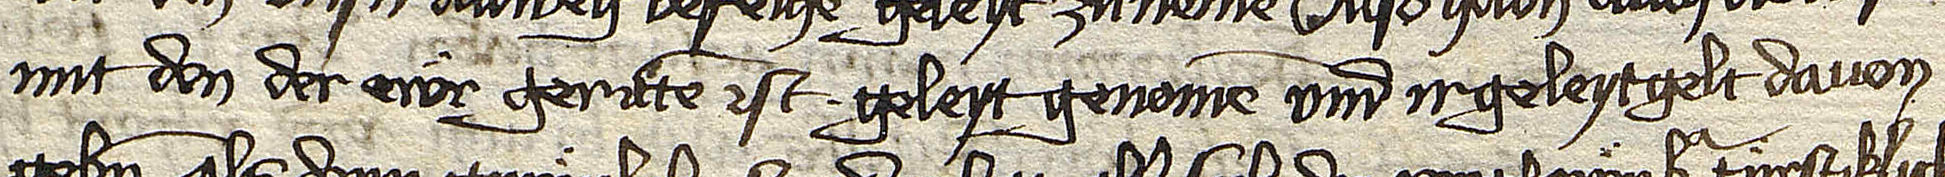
mit den der eẅr geritte* iſt . geleyt genome* vnd ir geleyt gelt dauon
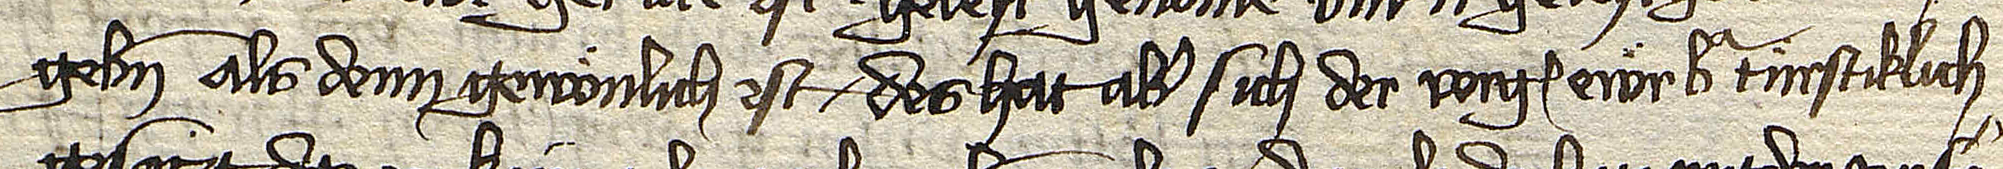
gebn* als denn gewönlich iſt / Des hat ab* ſich der vorg* eẅr b* türſtiklich
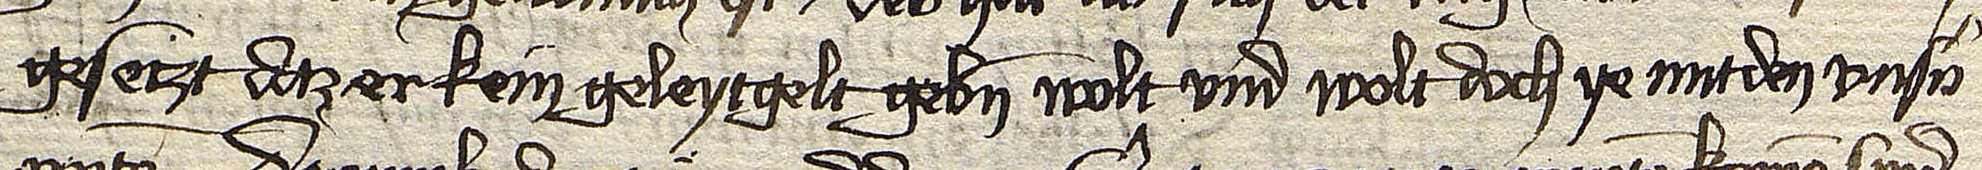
geſecʒt daʒ er kein geleytgelt gebn* wolt vnd wolt doch ye mit den vnſn*
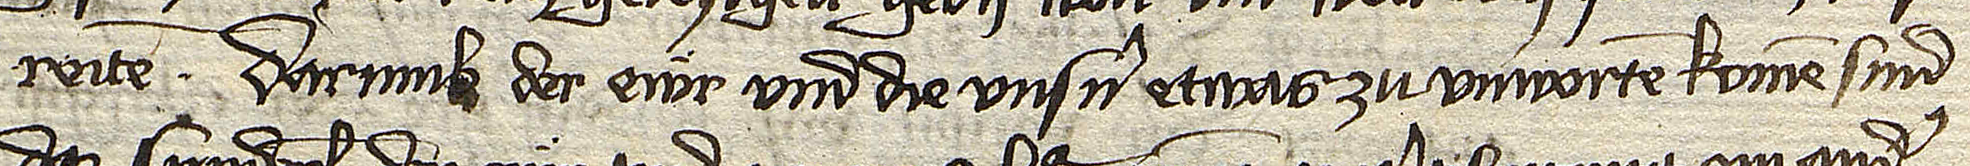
reite* . Darumb der eẅr vnd die vnſn* etwas ʒu vnworte* kome* ſind
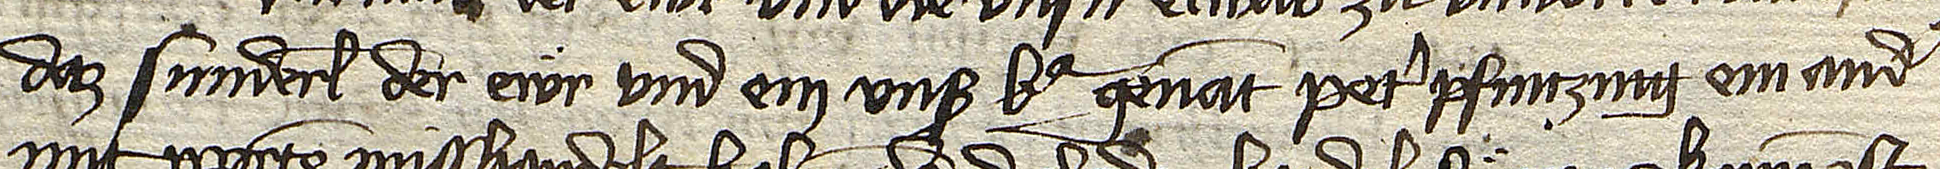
daʒ ſunderl* der eẅr vnd ein vnſ* b* gena*t Pet* pfincʒing ein and*
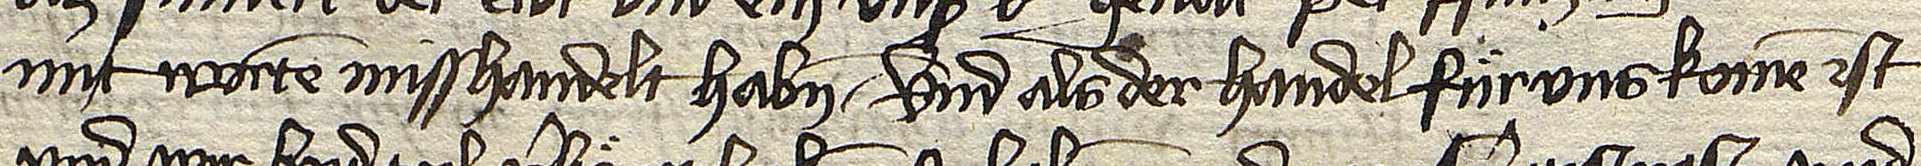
mit worte* miſſhandelt habn* / Vnd als der handel für vns kome* iſt
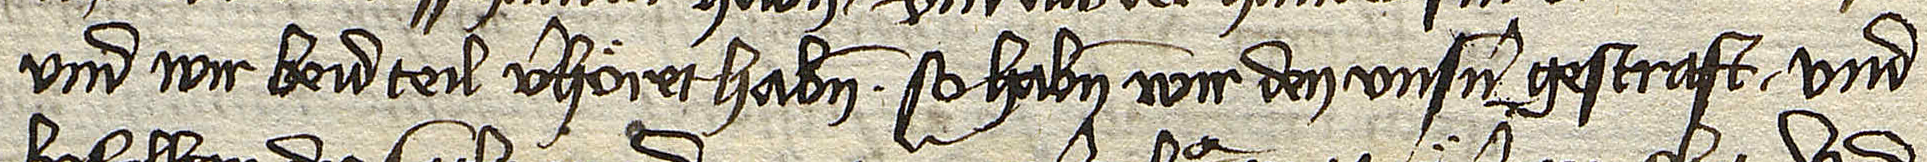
vnd wir beid teil v*höret habn* . ſo habn* wir den vnſn* geſtraft / vnd
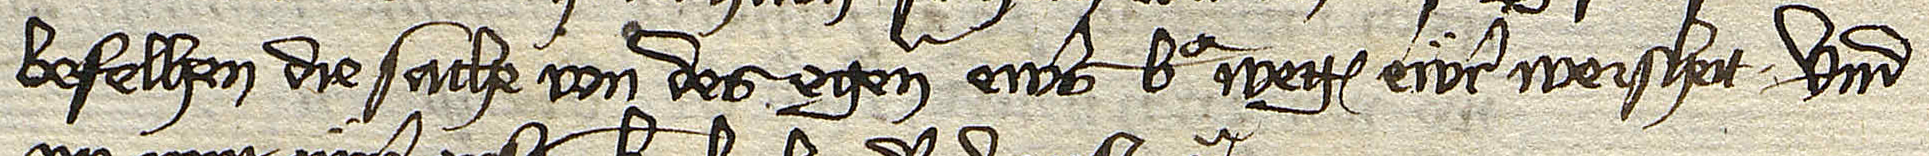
befelhen die ſache von des egen* ew*s b* weg* eẅr* weiſheit / Vnd
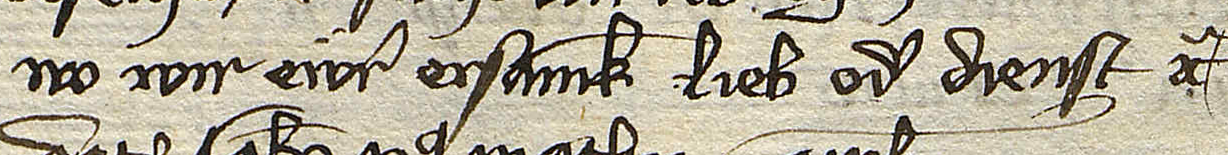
wo wir eẅr* erſamk* lieb od* dienſt ec*
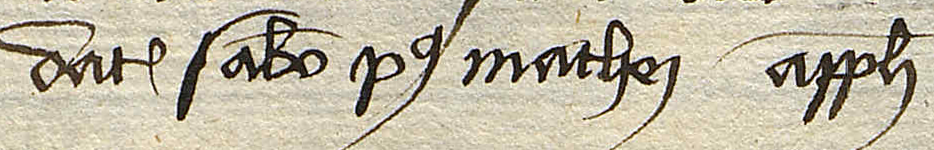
Dat* ſabo* p* mathei appli*
